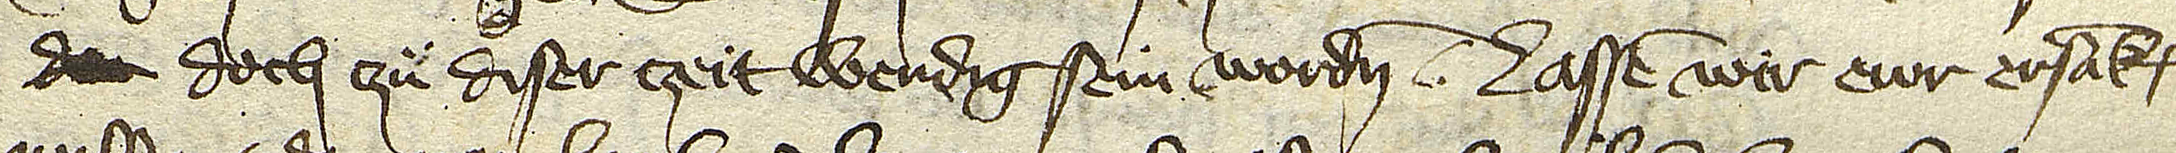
d%% doch cʒü diſer cʒeit wendig ſein wordn* / . Laſſe* wir ewr erſak*
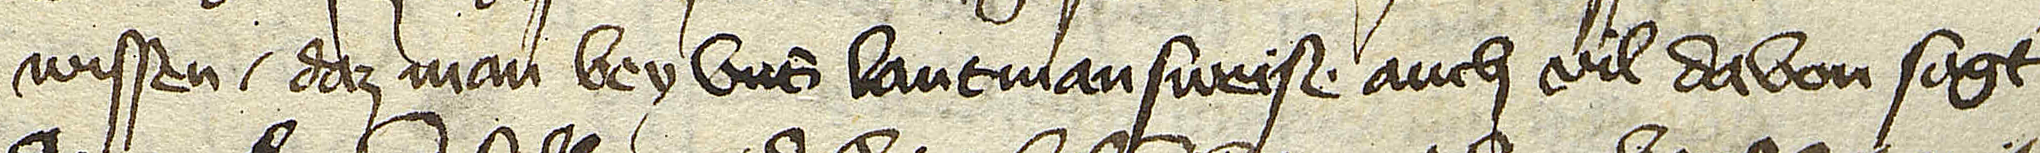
wiſſen / daʒ man bey vns lantmanſweiſe auch vil davon ſagt
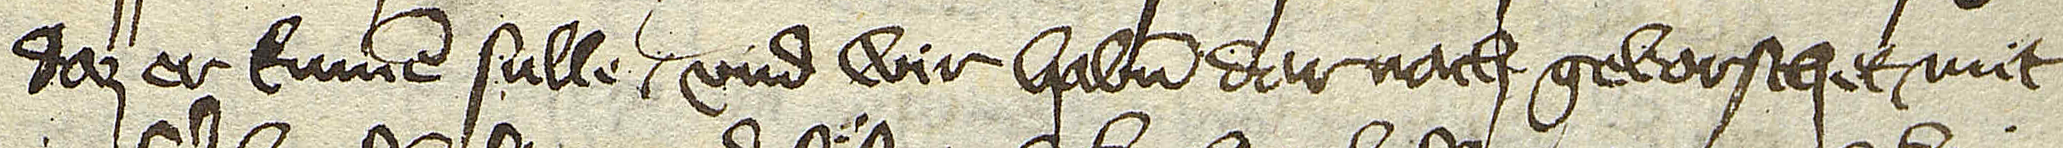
daʒ er kume* ſulle / vnd wir habn* dar nach gevorſchet mit
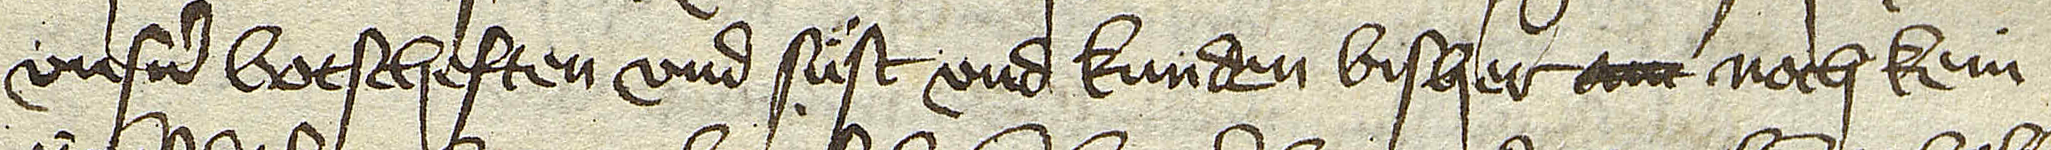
vnſn* botſcheften vnd ſüſt vnd kunden biſher am noch kein
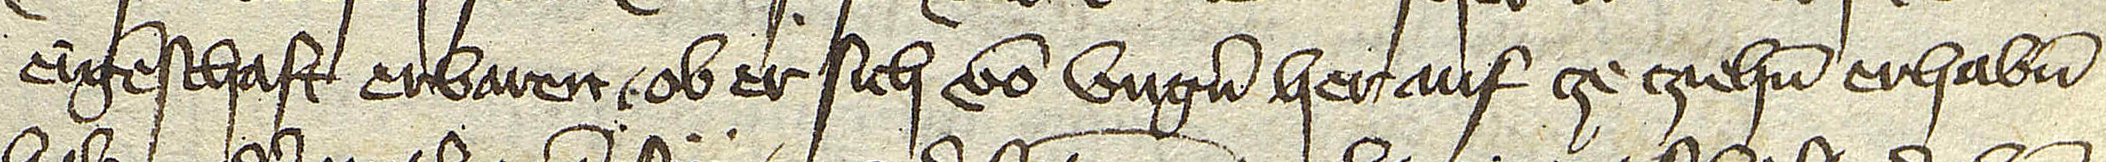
eige*ſchaft ervaren / ob er ſich vo* vngn* her auf cʒe cʒiehn* erhabn*
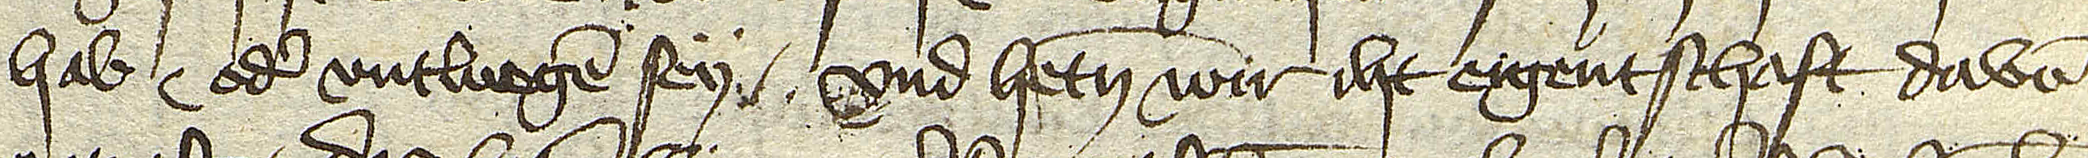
hab / od* vnt*wege* ſey / . vnd hetn* wir iht eigentſchaft davo*
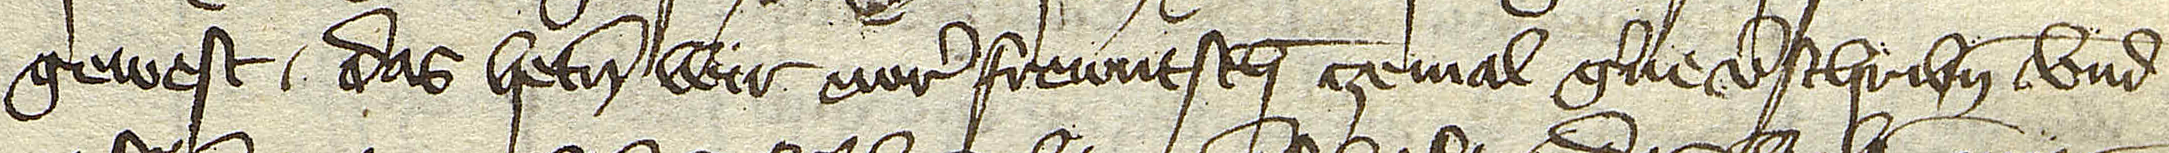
geweſt / Das hetn* wir ewr* frewntſch* cʒemal g*ne v*ſchribn* / vnd
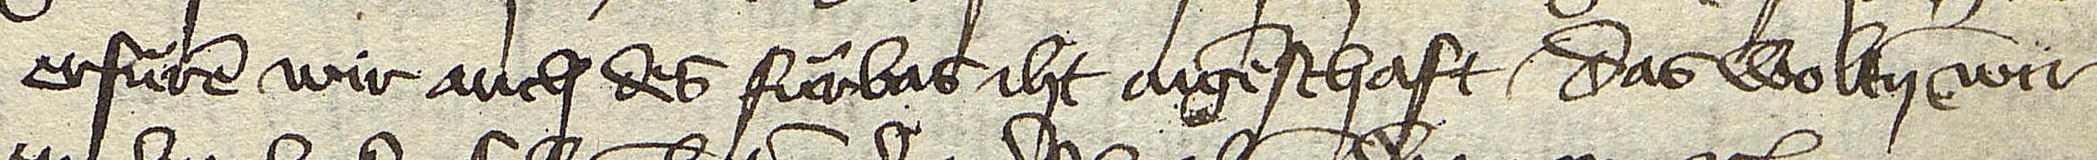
erfüre* wir auch des fürbas iht aige*ſchaft / Das woltn* wir
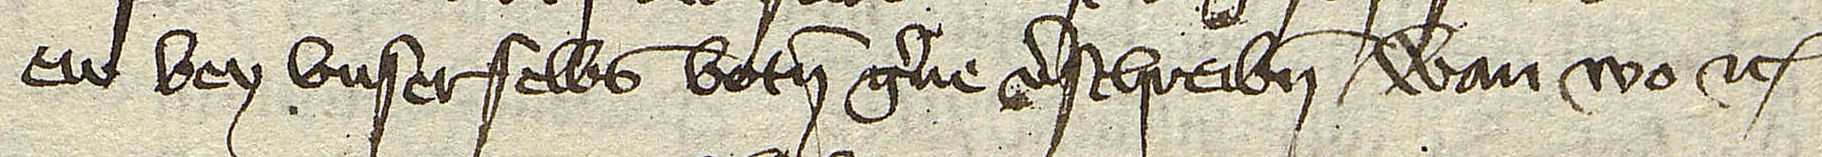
ew bey vnſer ſelbs botn* g*ne v*ſchreibn* / Wan wo ec*
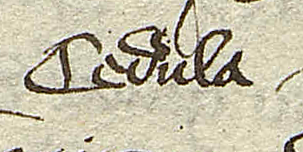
Cedula /
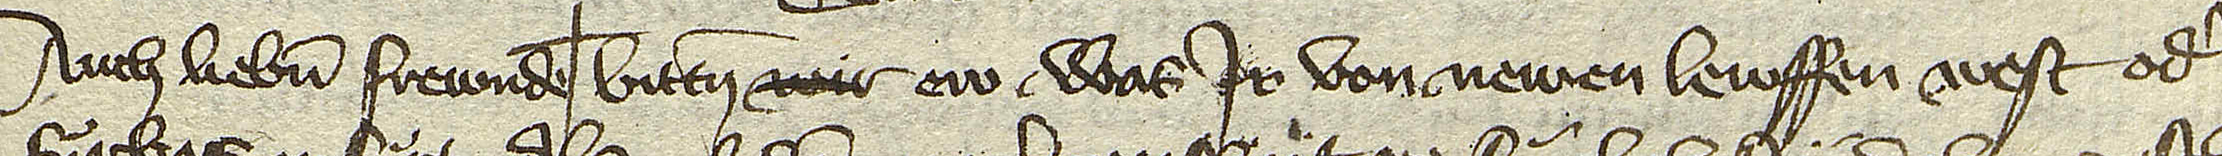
Auch liebn* frewnde bittn* wir ew / was Ir von newen lewffen weſt od*
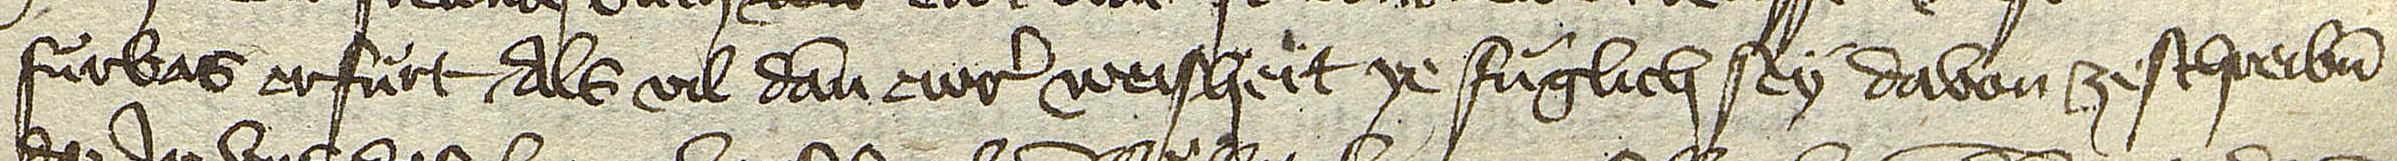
fürbas erfürt / Als dan* ewr* weiſheit ye füglich ſey davon cʒeſchreibn*
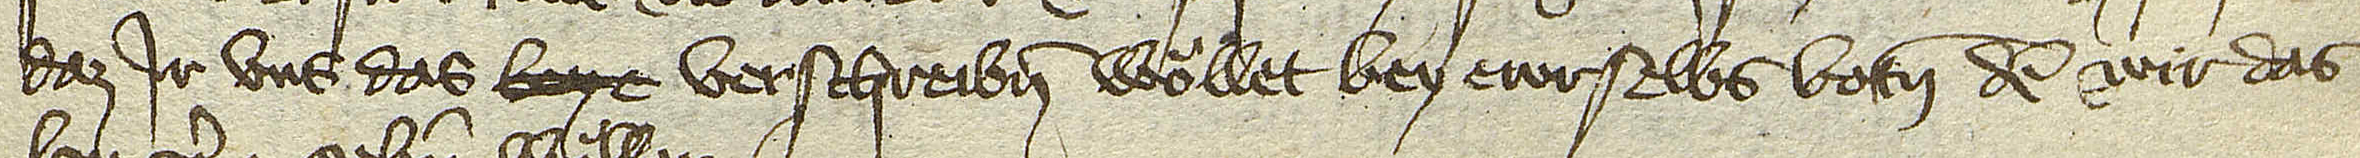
daʒ Ir vns das bey e verſchreibn* wöllet bey ewrſelbs botn* d* wir das
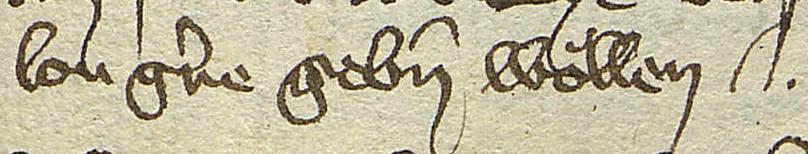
lon g*ne gebn* wöllen / .
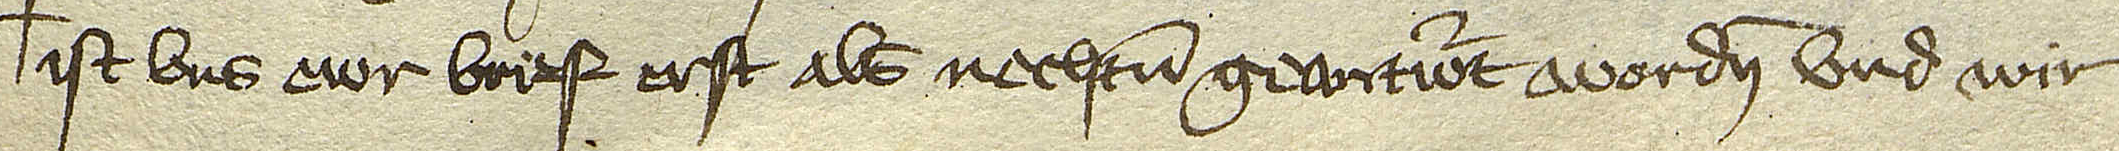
iſt vns ewr brief erſt als nechtn* geantw*t wordn* vnd wir
